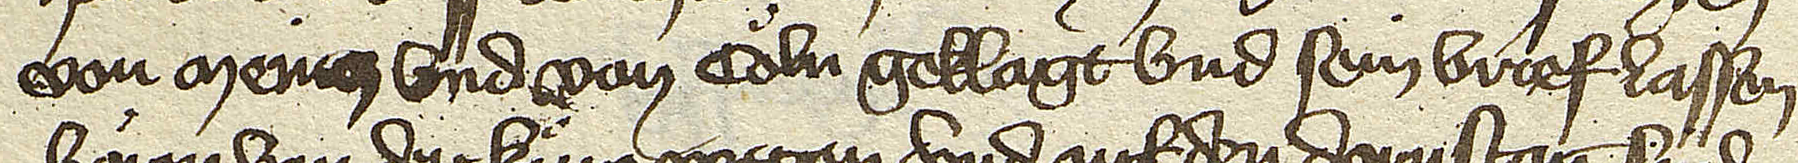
von Meincʒ vnd von Cöln geklagt vnd ſein brief laſſen
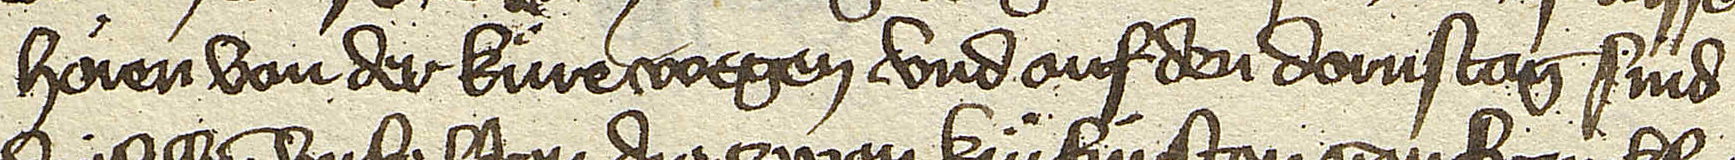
hören von der küre wegen / vnd auf den dornſtag ſind
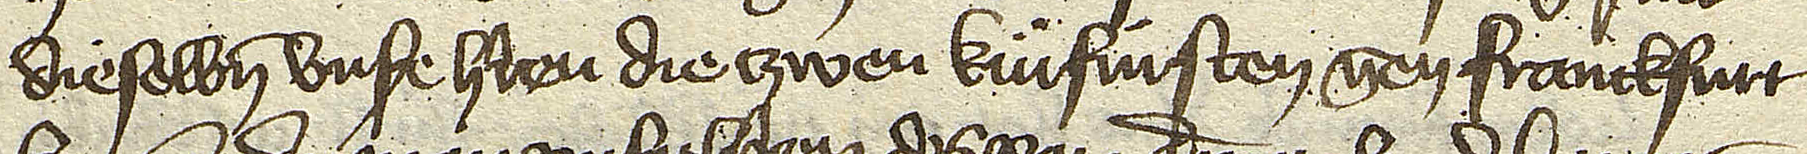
dieſelbn* vnſ*e hr*en die cʒwen kürfürſten gen franckfurt
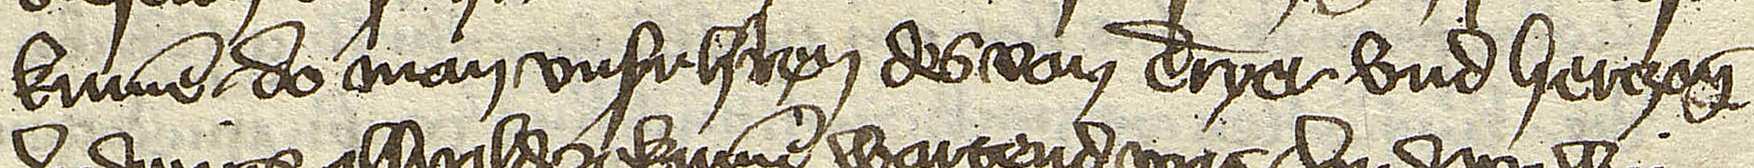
kume* / do man vnſ*r hr*en des von Tryer vnd hercʒog
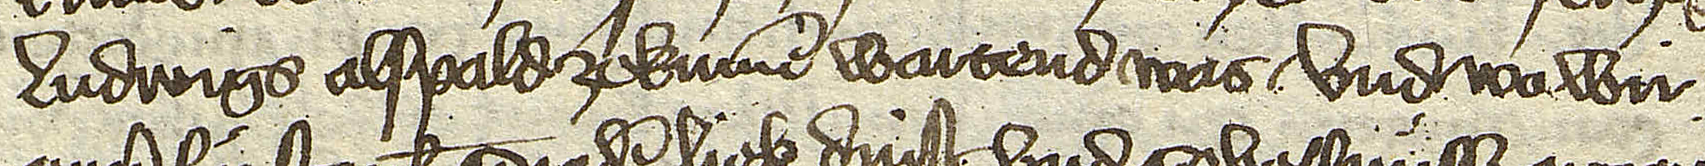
Ludwigs alsſpald cʒekume* wartend was / vnd wo wir
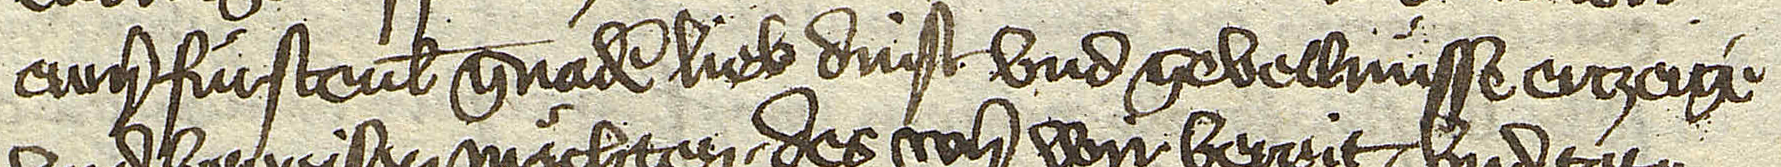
ewn* fürſtenl* gnad* lieb dinſt vnd gevellnüſſe ercʒeige*
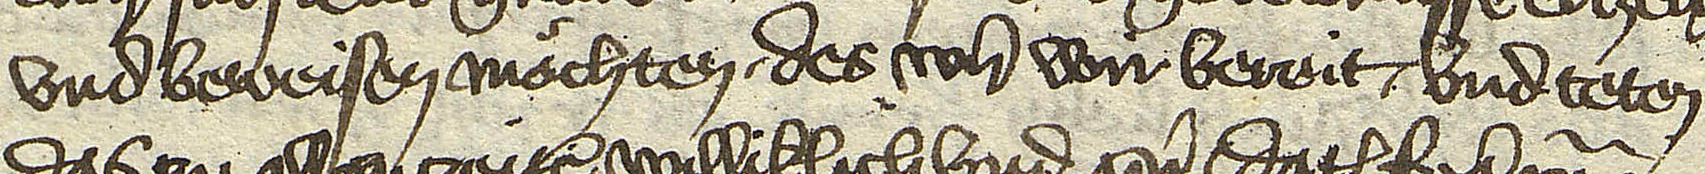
vnd beweiſen möchten / des w*n wir bereit / vnd teten
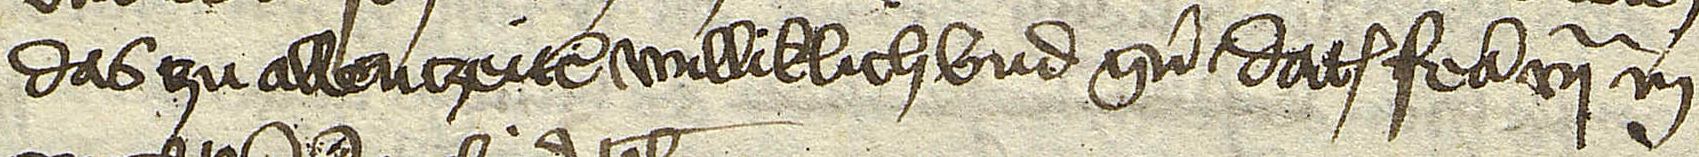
das cʒu allencʒeite* williklich vnd gn* / dat* fea* iii* in
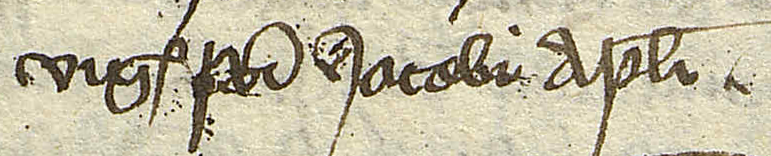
vig* ſci* Iacobi Apli* /
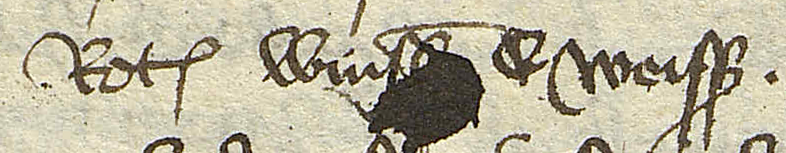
Rot* Winſh* C weiſſ* .
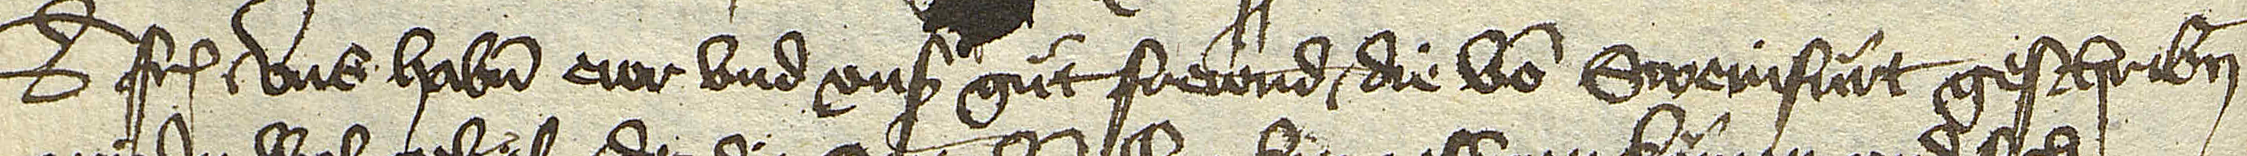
L* fr* / Vns habn* ewr vnd vnſ* güt frewnd / die vo* Sweinfürt geſchribn*
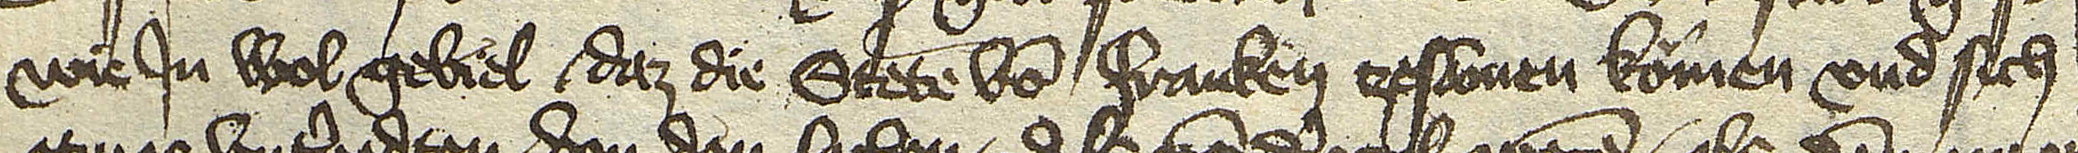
wie In wol geviel / daʒ die Stete vo* Franken cʒeſamen kömen vnd ſich
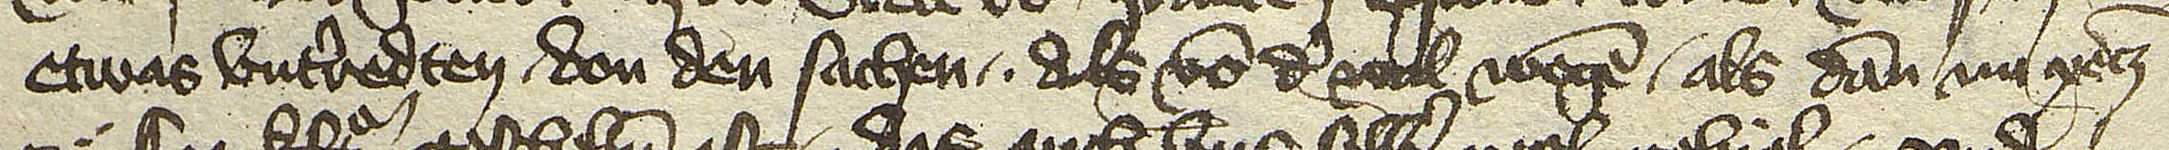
etwas vnt*redten / von den ſachen / . Als vo* d* wal wege* / als dan* nu yecʒ*
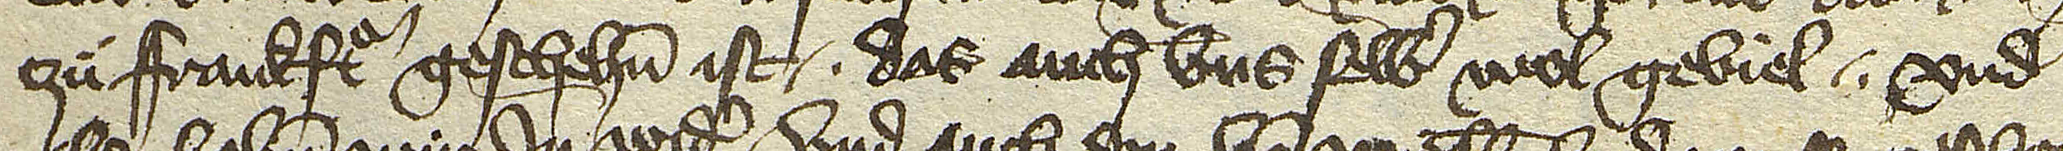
cʒü frankft* geſchehn* iſt / . das auch vns ſelb* wol geviel / . vnd
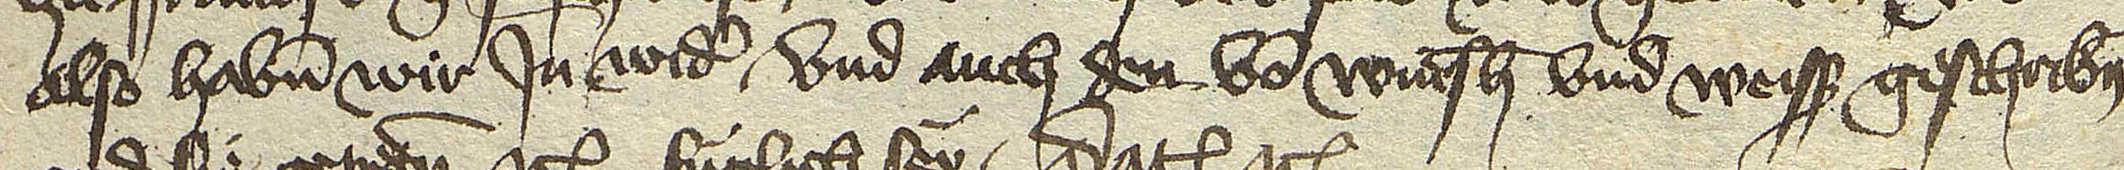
alſo habn* wir In wid* / vnd auch den vo* winſh* vnd weiſſ* geſchribn*
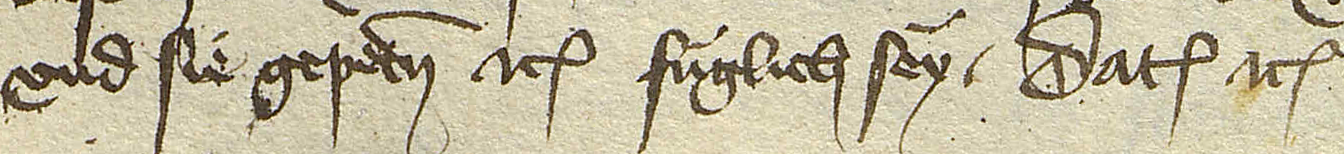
vnd ſie gepetn* ec* füglich ſey / Dat* ec*
